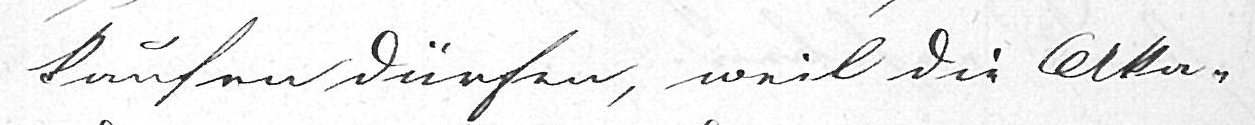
kaufen dürfen, weil die Aka-
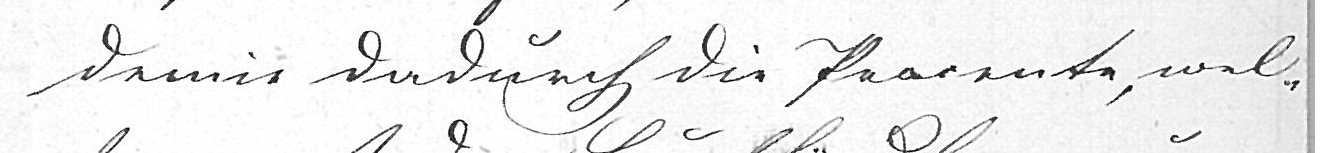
demie dadurch die Procente, wel-
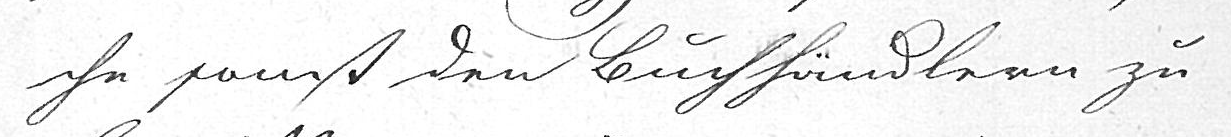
che sonst den Buchhändlern zu
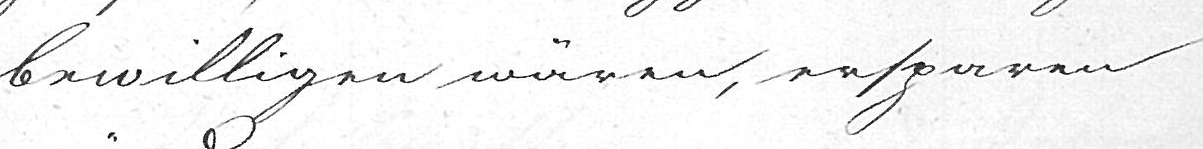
bewilligen wären, ersparen
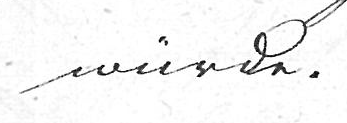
würde.
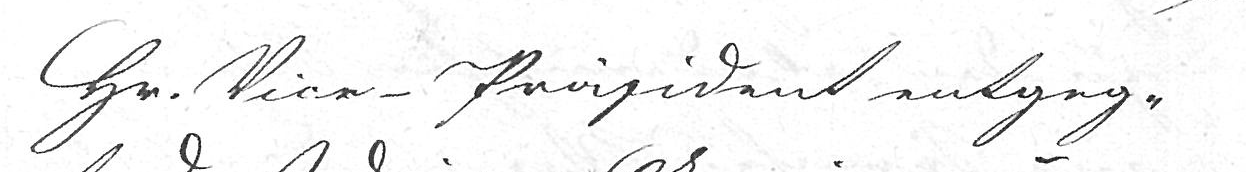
Hr. Vice-Präsident entgeg-
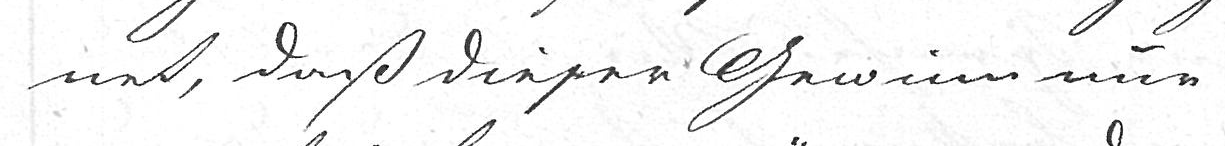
net, daß dieser Gewimn nur
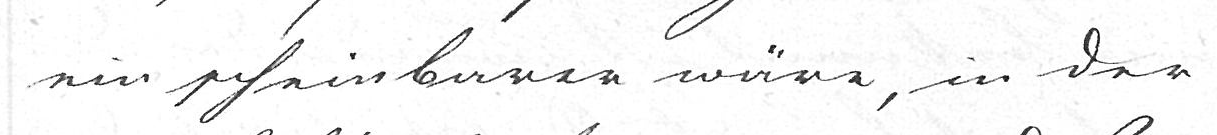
ein scheinbarer wäre, in der
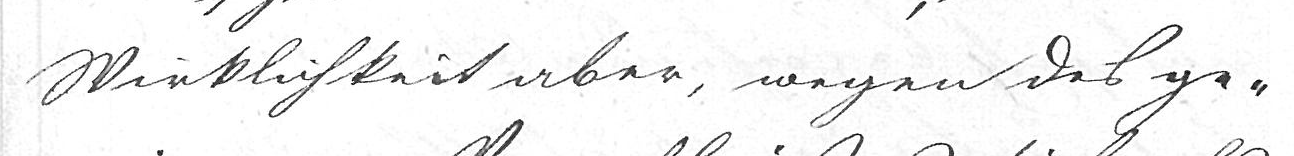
Wirklichkeit aber, wegen des ge-
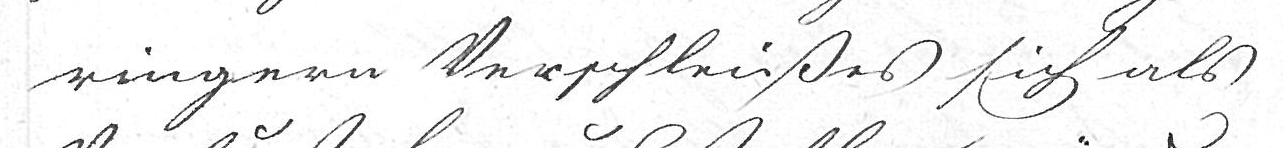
ringern Verschleißes sich als
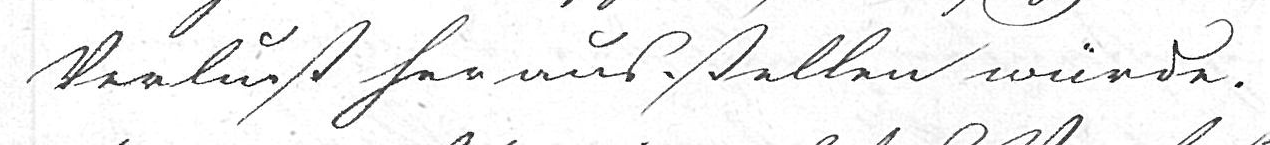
Verlust herausstellen würde.
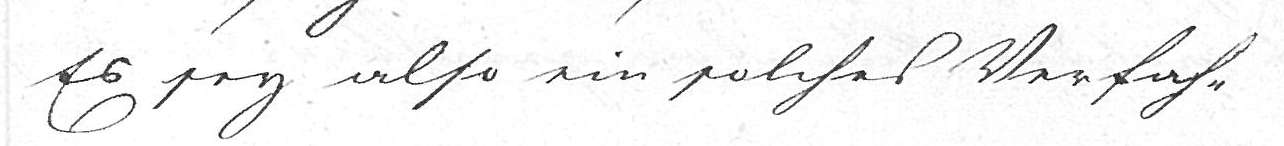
Es sey also ein solches Verfah-
